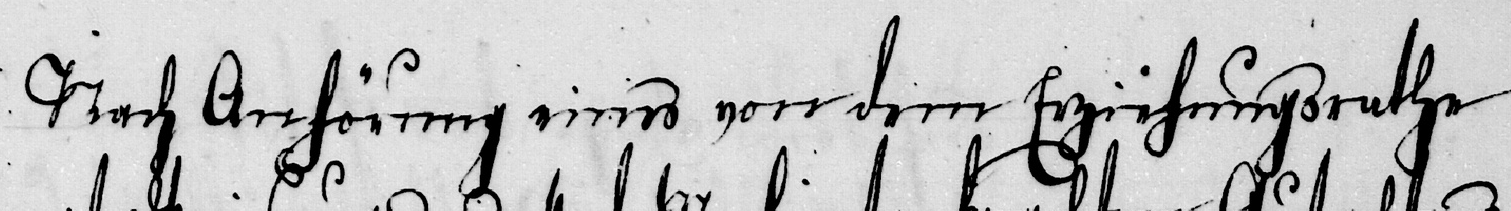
Nach Anhörung eines von dem Erziehungsrathe
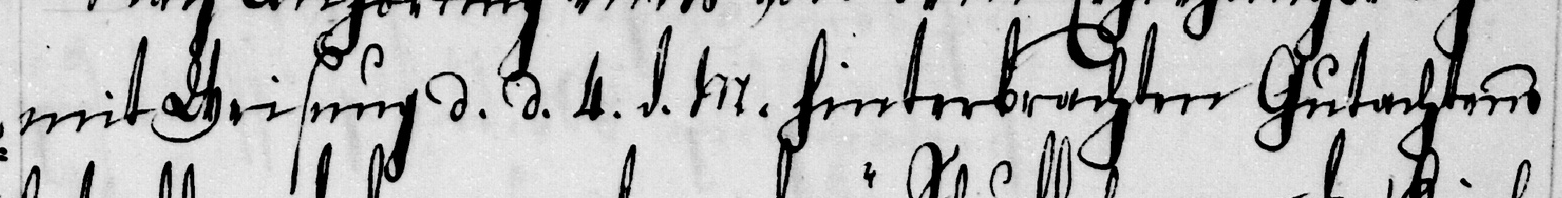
mit Weisung d. d. 4. d. M. hinterbrachten Gutachtens
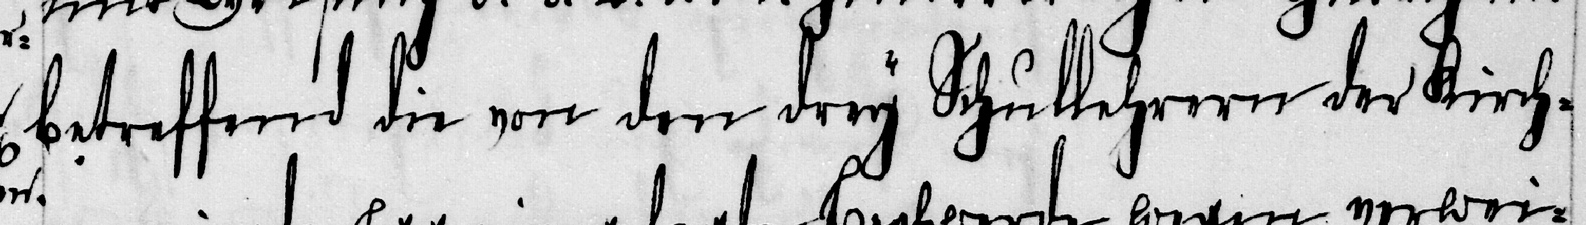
betreffend die von den drey Schullehrern der Kirch¬
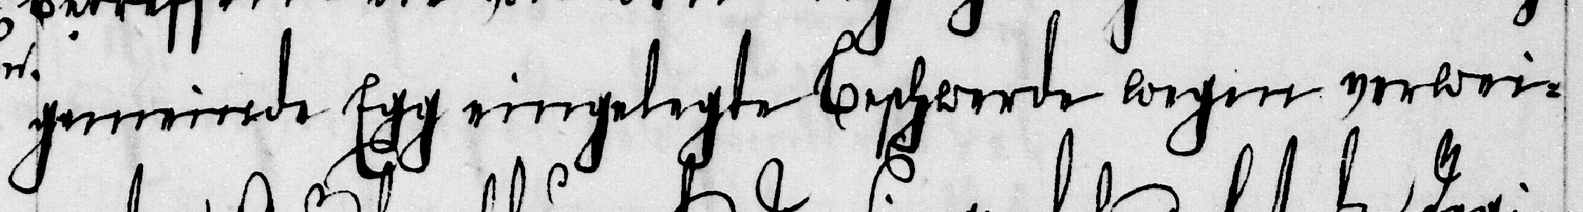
gemeinde Egg eingelegte Beschwerde wegen verwei¬
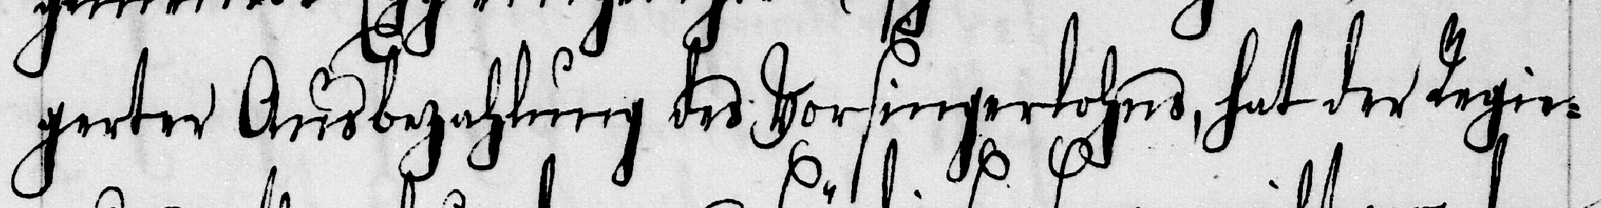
gerter Ausbezahlung des Vorsingerlohns, hat der Regie¬
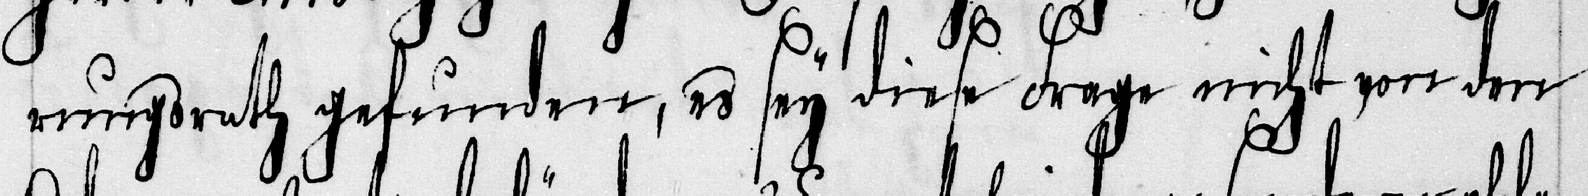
rungsrath gefunden, es sey diese Frage nicht von den
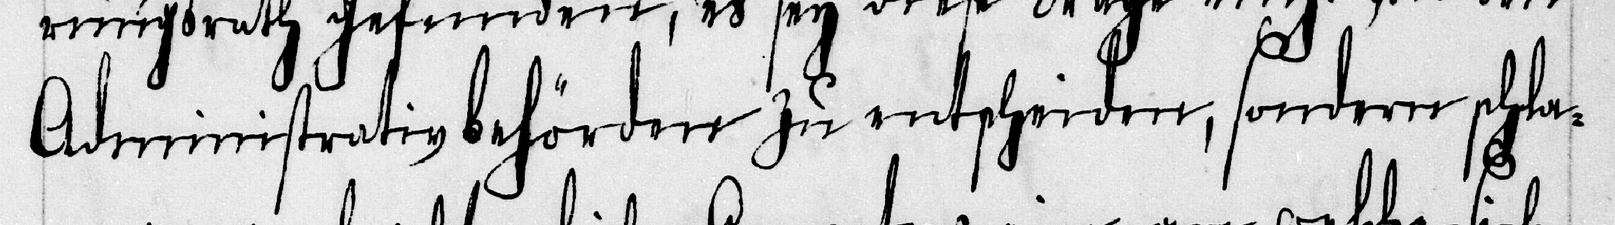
Administrativbehörden zu entscheiden, sondern schla¬
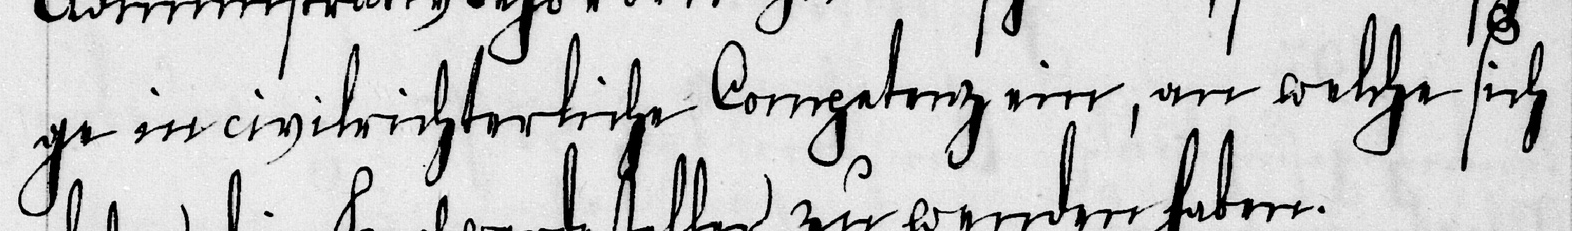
ge in civilrichterliche Competenz ein, an welche sich
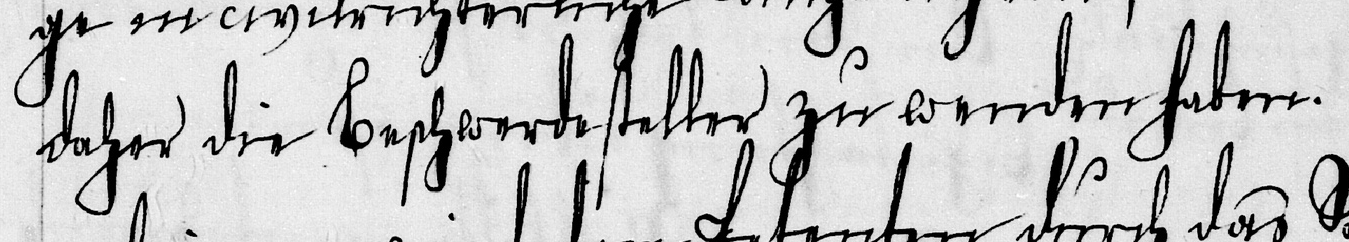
daher die Beschwerdesteller zu wenden haben.
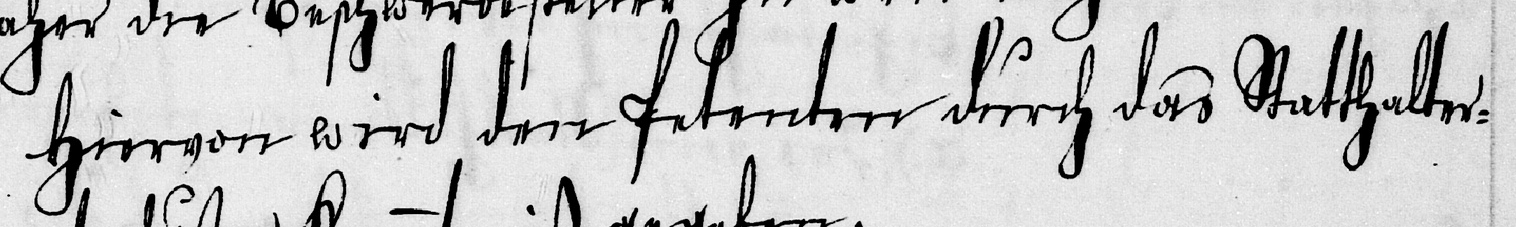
Hiervon wird den Petenten durch das Statthalt¬
